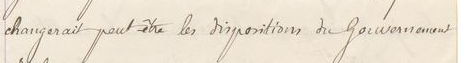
changerait peut-être les dispositions du Gouvernement
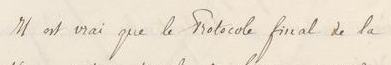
Il est vrai que le Protocole final de la
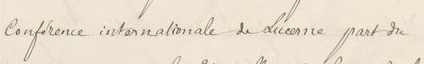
Conférence internationale de Lucerne part du
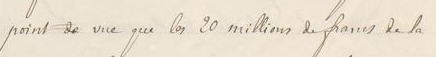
point de vue que les 20 millions de francs de la
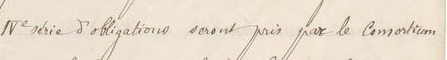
IVe série d'obligations seront pris par le Consortium
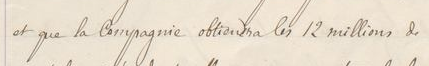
et que la Compagnie obtiendra les 12 millions de
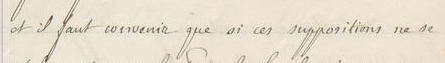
et il faut convenir que si ces suppositions ne se
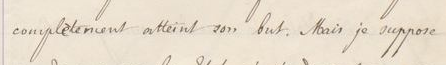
complètement atteint son but. Mais je suppose
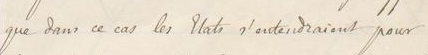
que dans ce cas les Etats s'entendraient pour
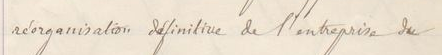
réorganisation définitive de l'entreprise du
